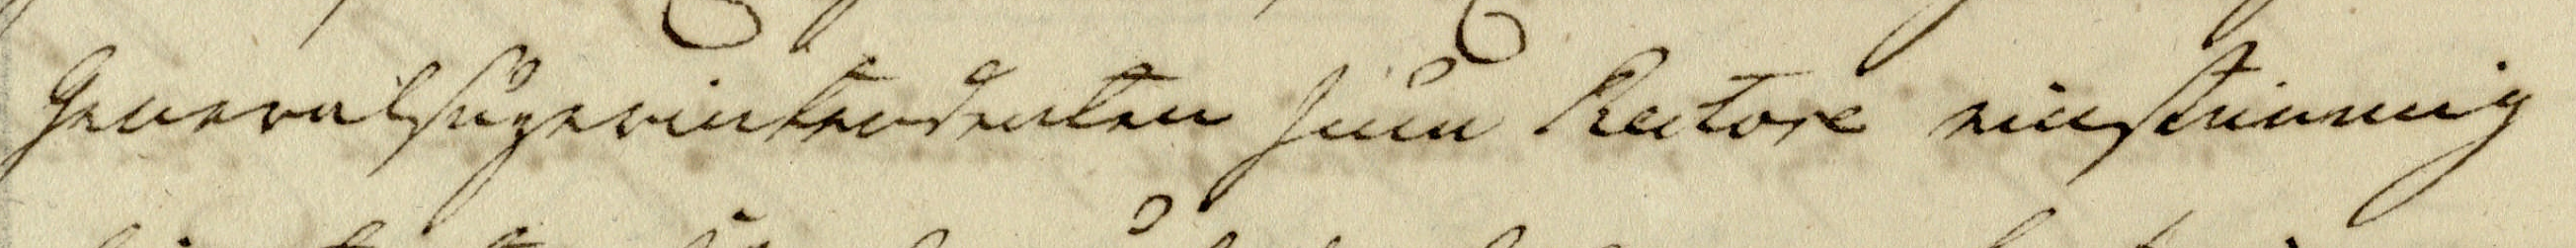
Generalsuperintendenten zum Rectore einstimmig
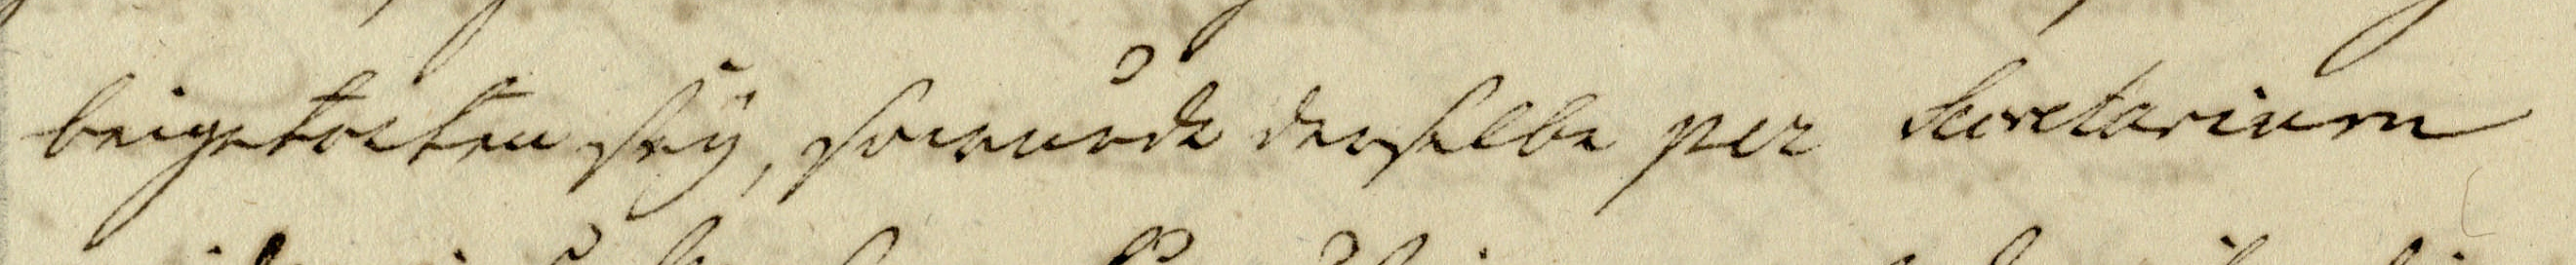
beigetreten seÿ, so wurde derselbe per Secretarium
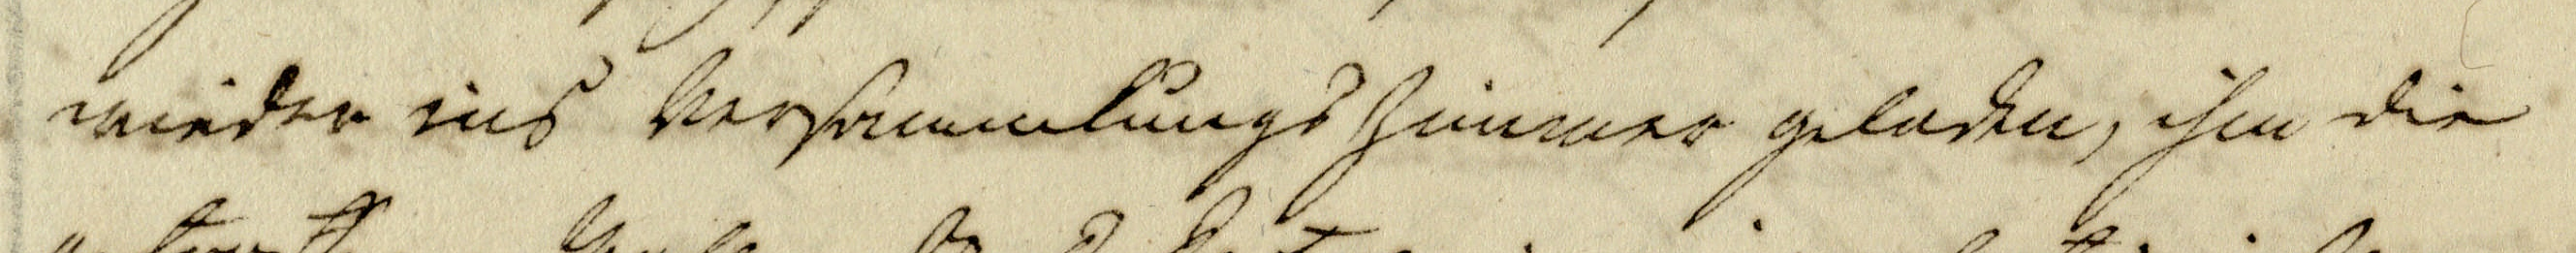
wieder ins VersammlungsZimmer geladen, ihm die
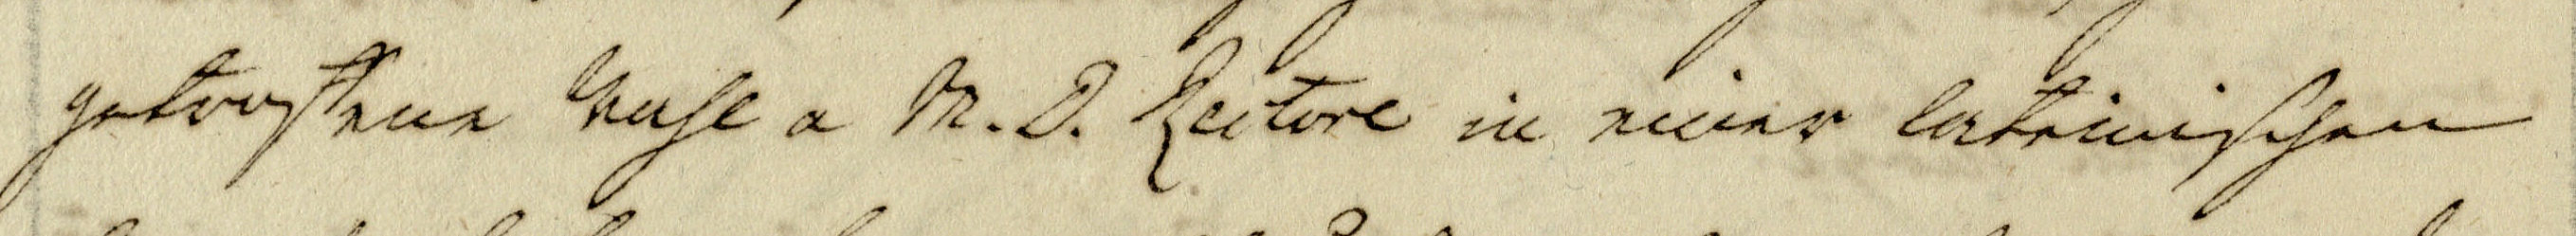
getroffene Wahl a M. D. Rectore in einer lateinischen
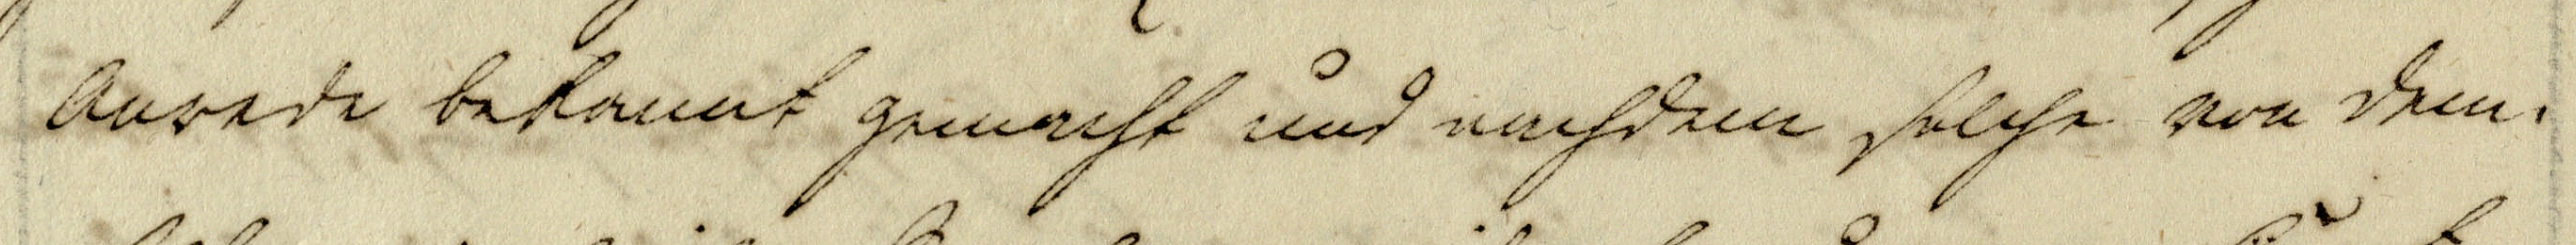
Anrede bekannt gemacht und nachdem solche von dem¬
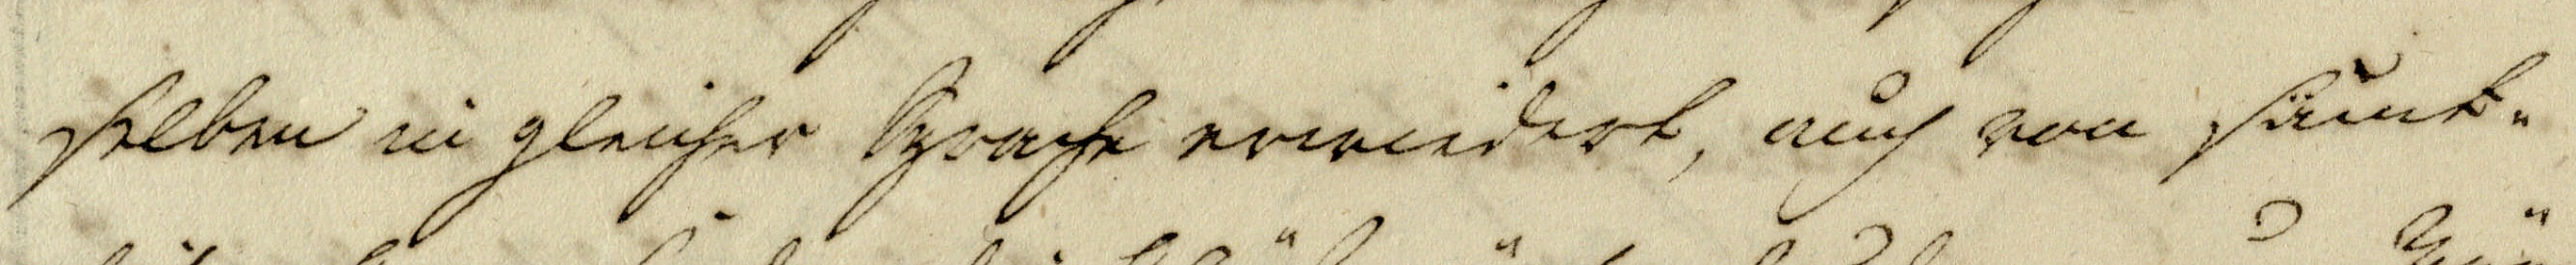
selben in gleicher Sprache erwiedert, auch von sämt¬
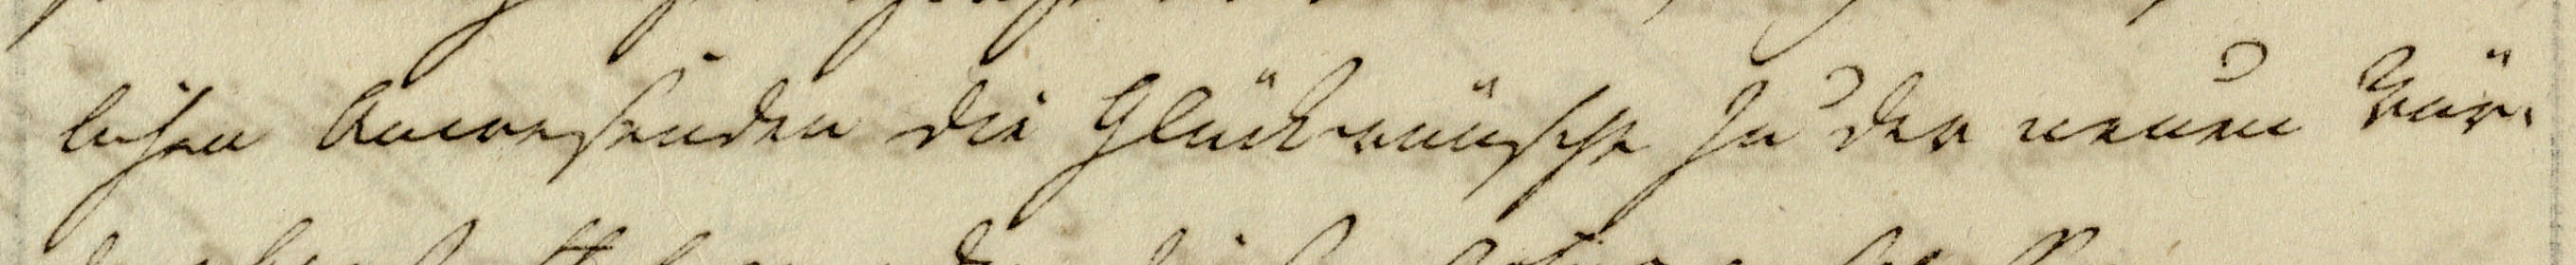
lichen Anwesenden die Glückwünsche zu der neuen Wür¬
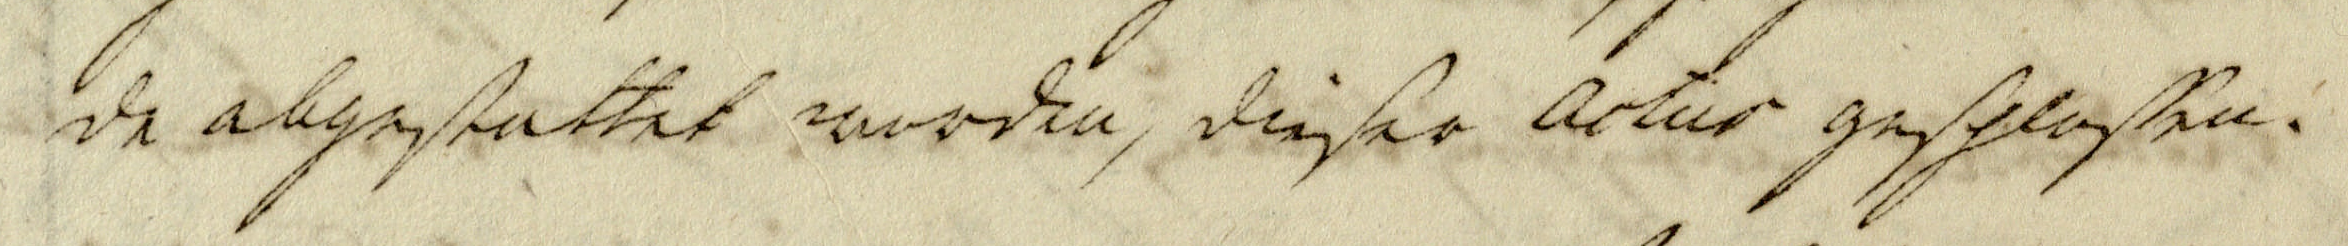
de abgestattet worden, dieser Actis geschlossen.
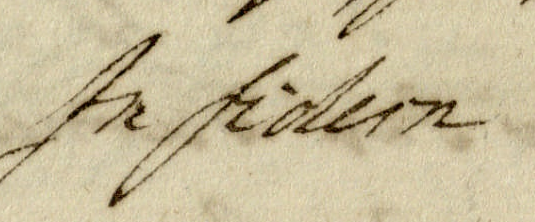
In fidem
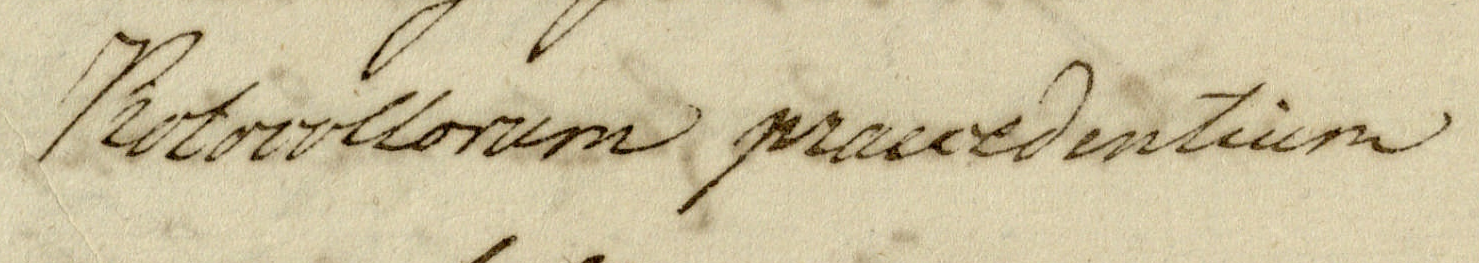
Protocollorum praecedentium
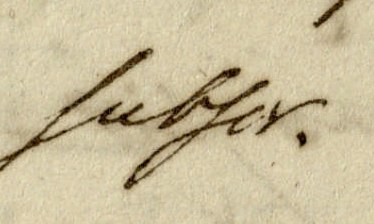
subser.
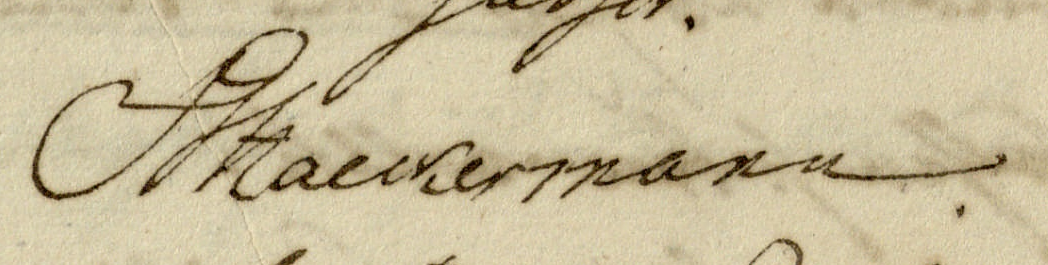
JTHaeckermann
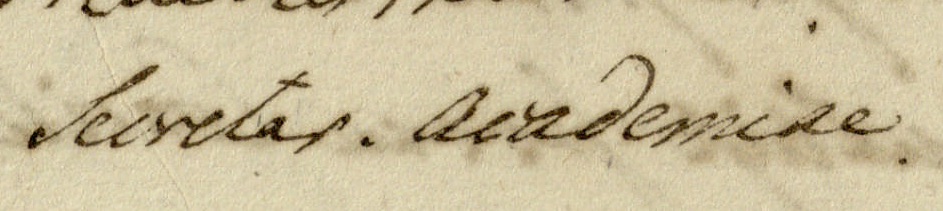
Seretar. Academiae
